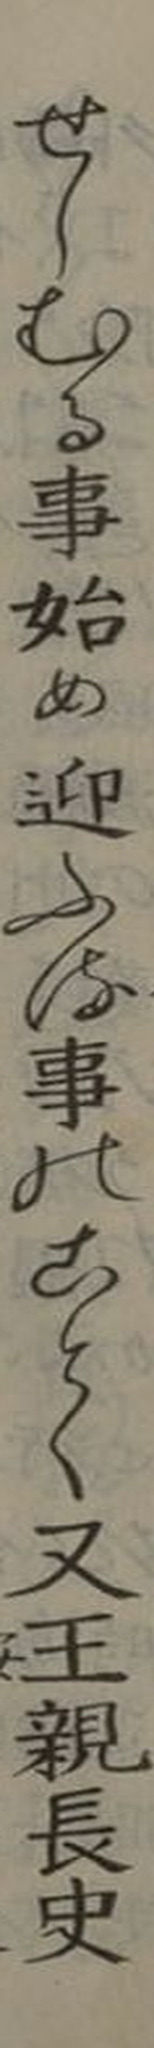せしむる事始め迎ふる事のことく又王親長史

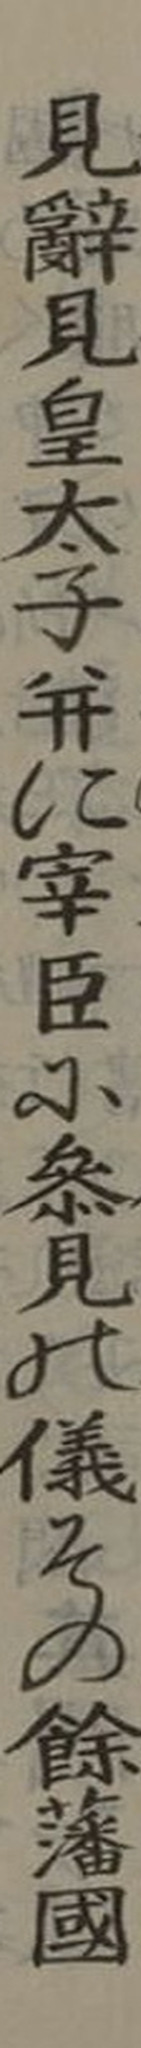見辭見皇太子并に宰臣に參見の儀その餘藩國
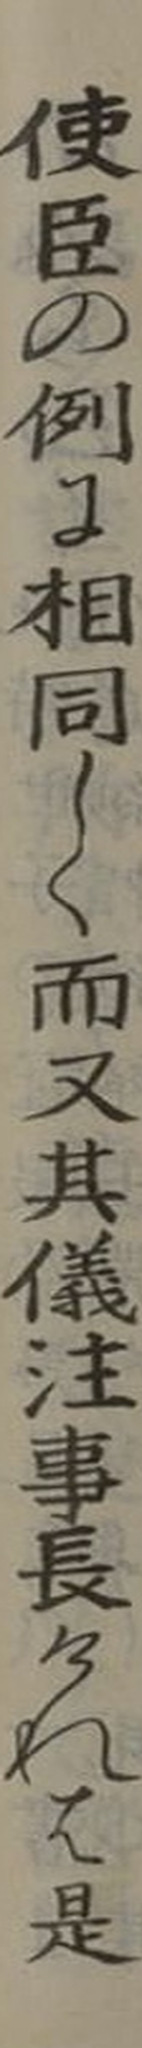使臣の例に相同しく而又其儀注事長けれは是
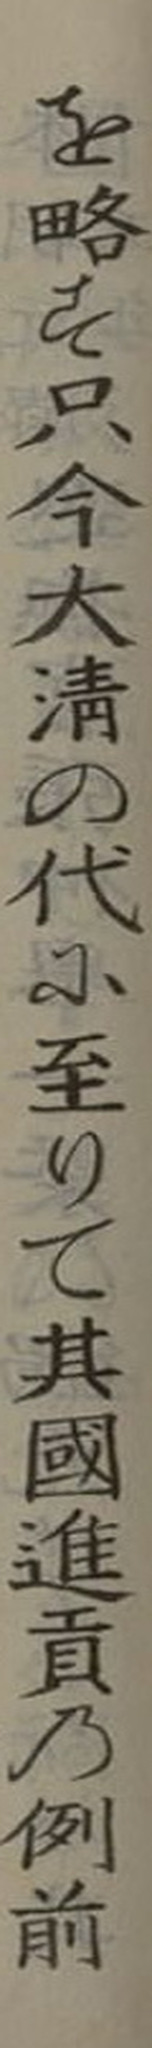を略す只今大淸の代に至りて其國進貢の例前
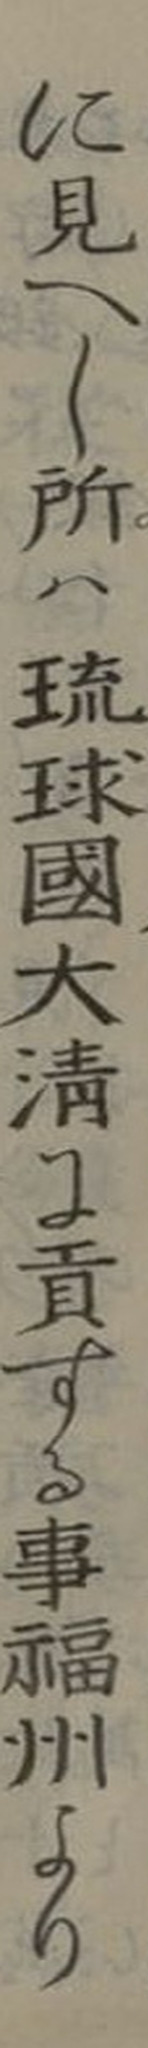に見へし所は琉球國大淸に貢する事福州より
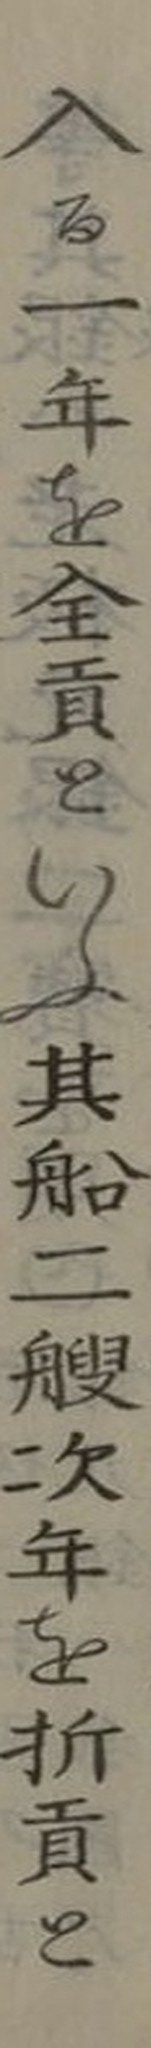入る一年を全貢といふ其船二艘次年を折貢と
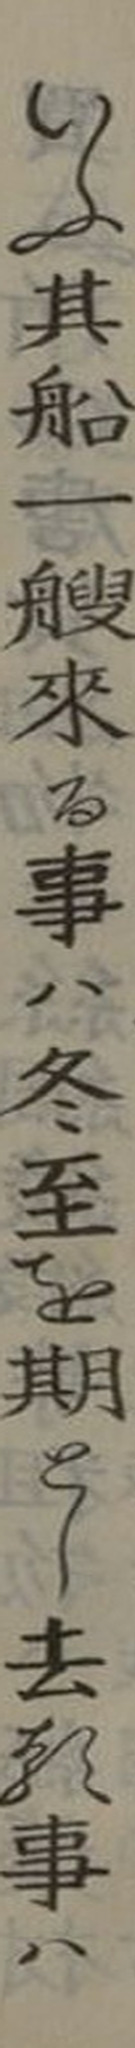いふ其船一艘來る事は冬至を期とし去る事は
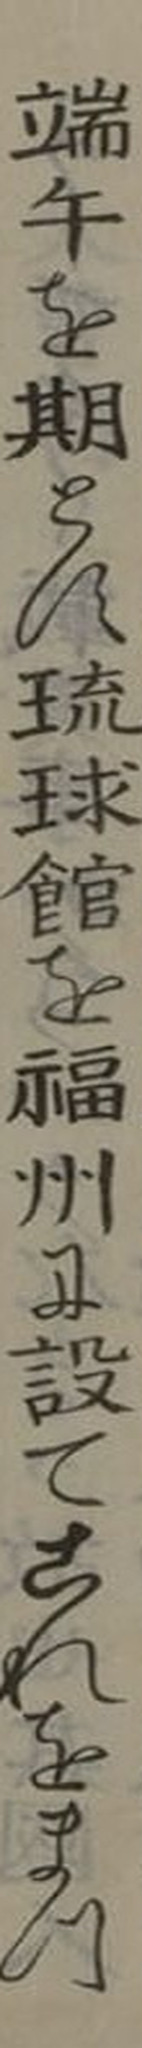端午を期とす琉球館を福州に設てこれをまつ
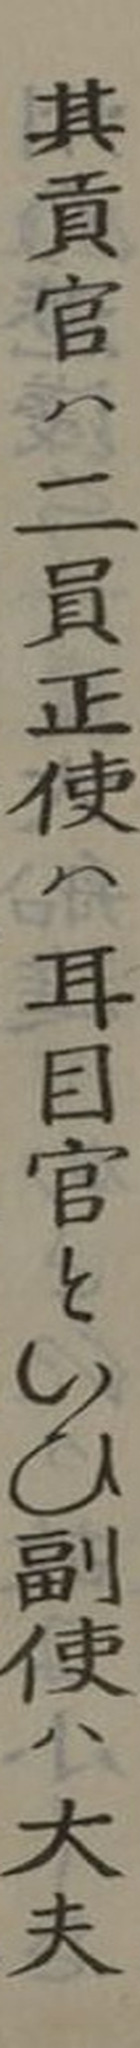其貢官は二員正使は耳目官といひ副使は大夫
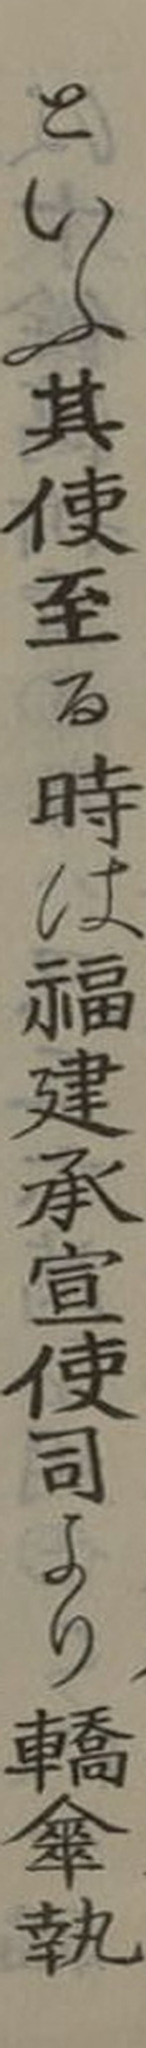といふ其使至る時は福建承宣使司より轎傘執
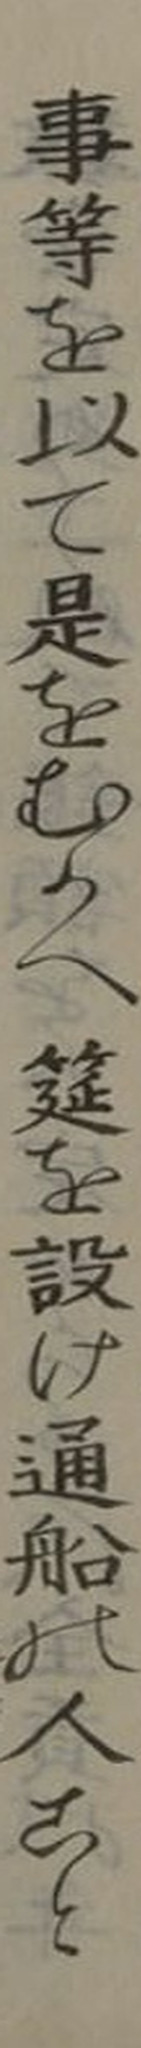事等を以て是をむかへ筵を設け通船の人こと
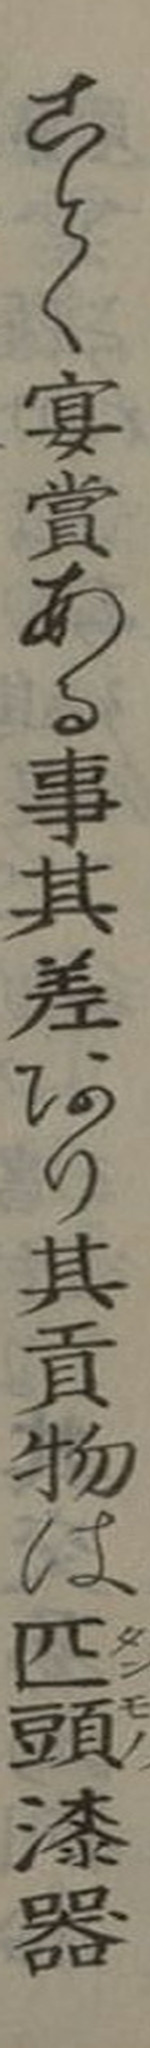ことく宴賞ある事其差あり其貢物は匹頭漆器
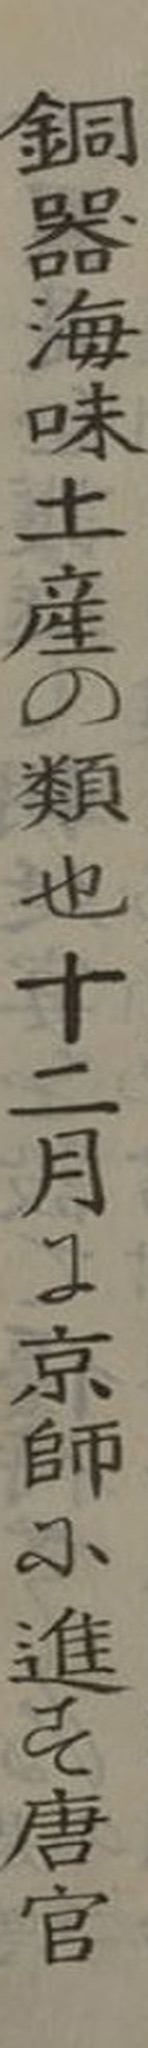銅器海味土産の類也十二月に京師に進す唐官

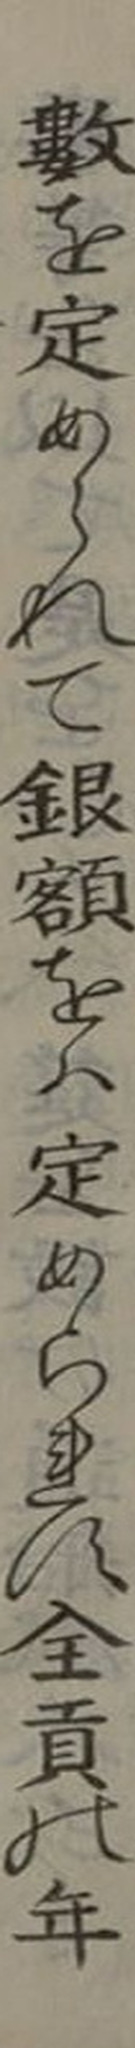數を定められて銀額をは定められす全貢の年
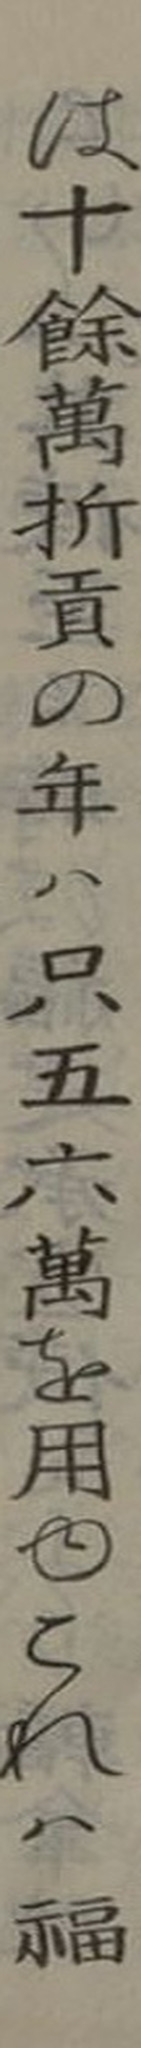は十餘萬折貢の年は只五六萬を用ゆこれは福
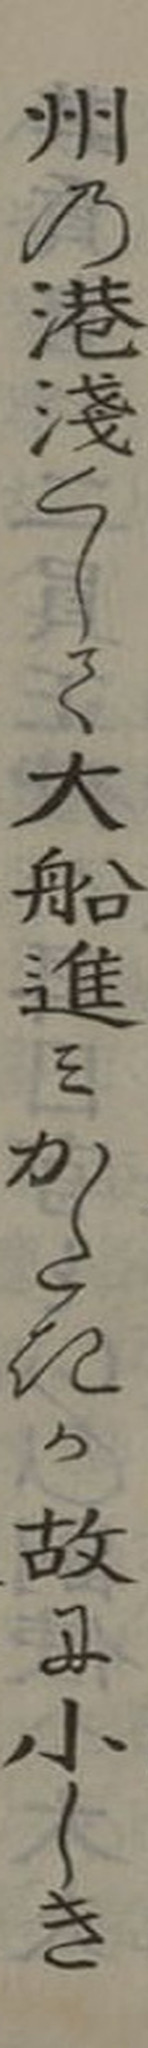州の港淺くして大船進みかたきか故に小しき
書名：骨董録
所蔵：University of the Ryukyus Library
